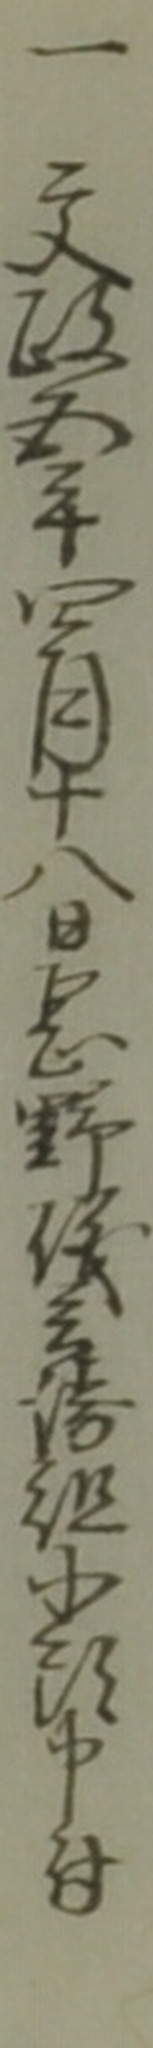一文政五午四月十八日岡野儀兵衛組小頭申付
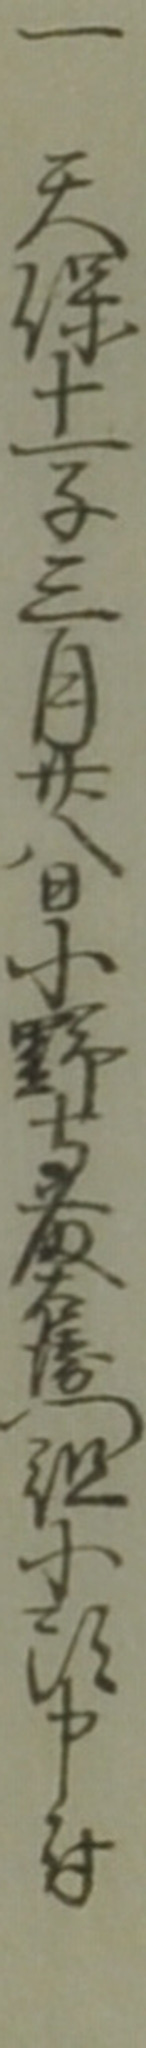一天保十一子三月廿八日小野寺藤右衛門組小頭申付
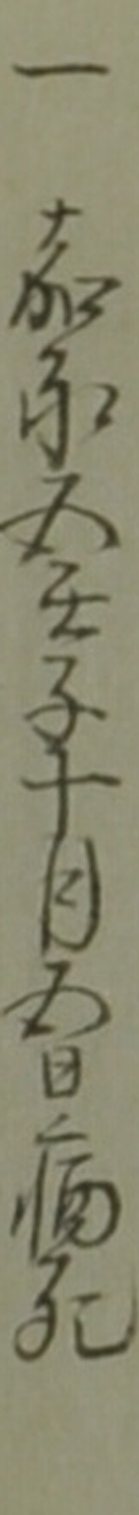一嘉永五壬子十月五日病死
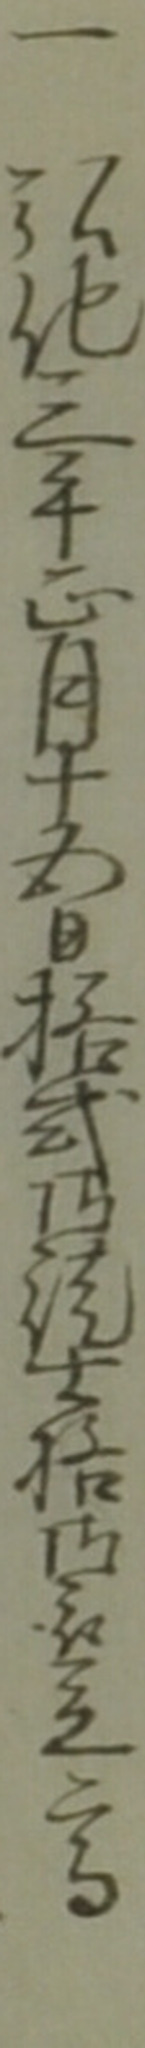一弘化三午正月十五日格式御徒士格御取立高
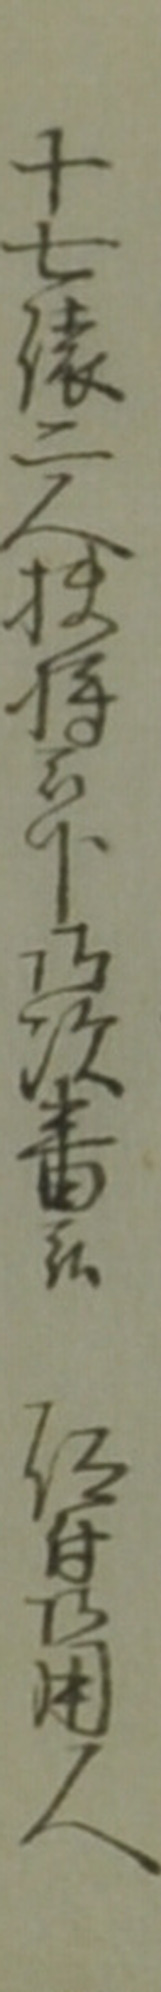十七俵二人扶持被下御次番被仰付御用人
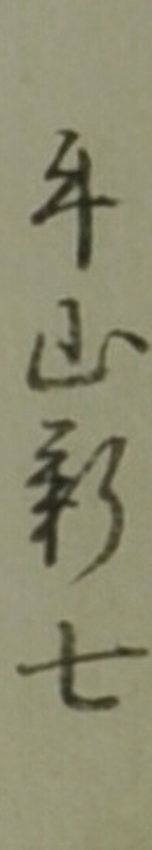牛山新蔵

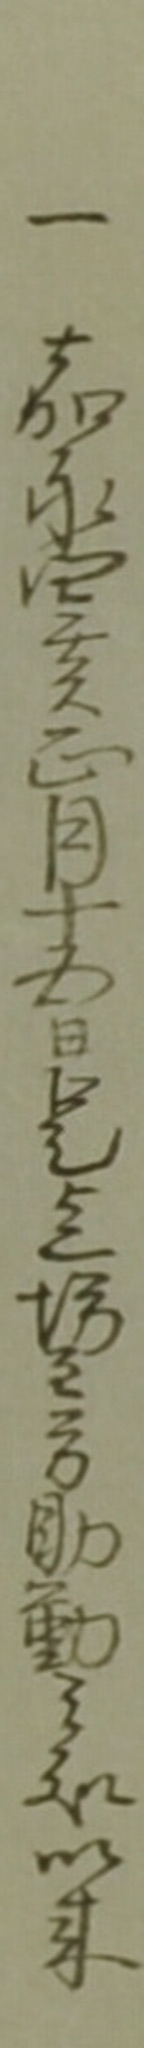一嘉永四亥正月十五日是迄坊主方助勤之処以来
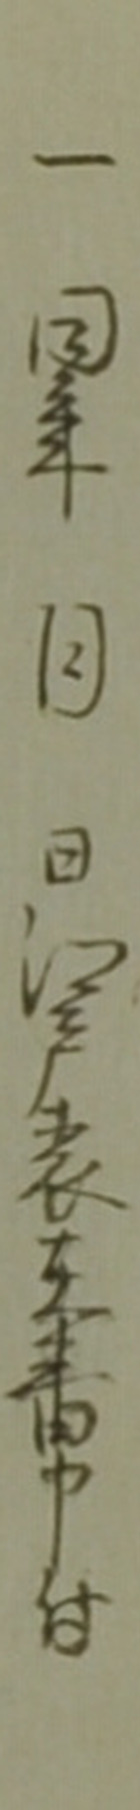一同年月日江戸表在番申付
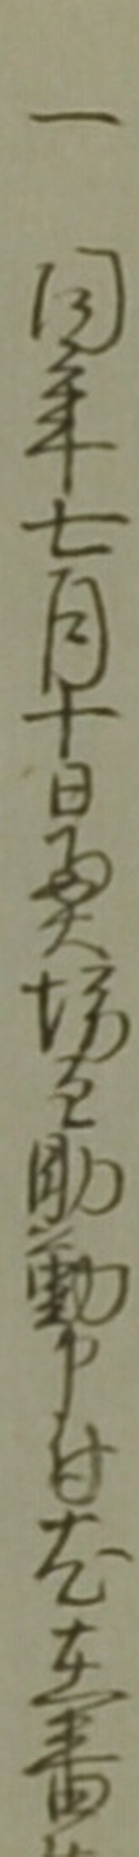一同年七月十日奥坊主女助勤申付尤在番先
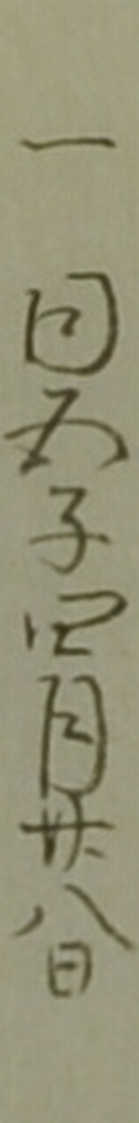一同五子四月廿八日
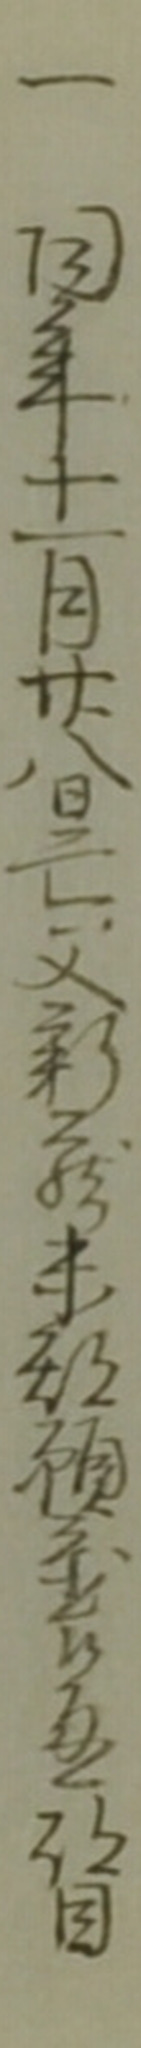一同年十一月廿八日亡父新蔵末期願置候通跡目
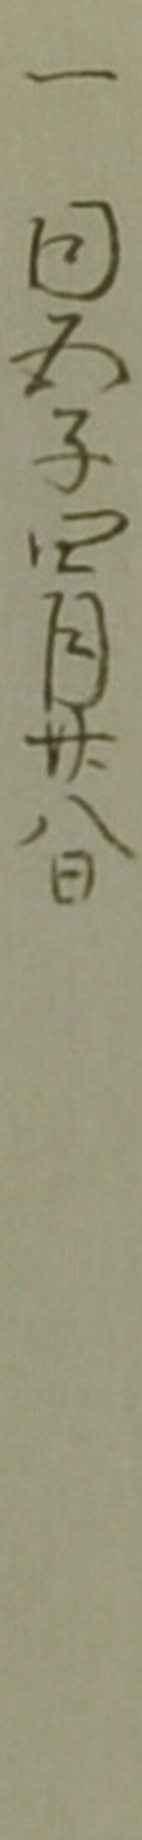一同五子四月廿八日
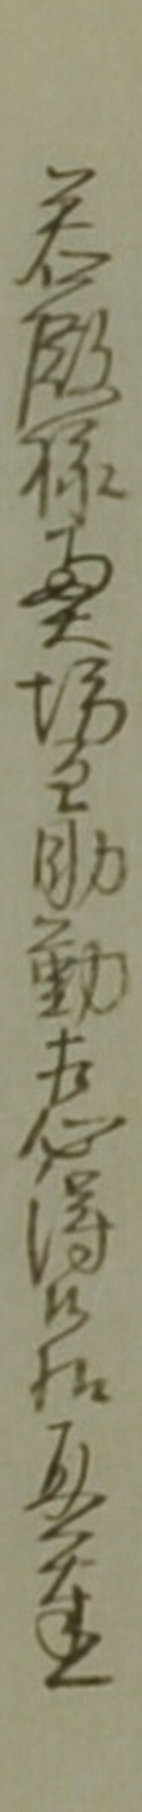若殿様奥坊主助勤相心得候様通達
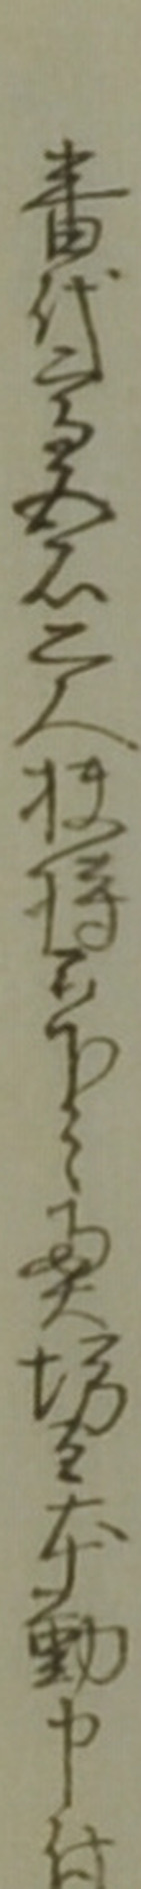番代高五石二人扶持被下之奥坊本勤申付候
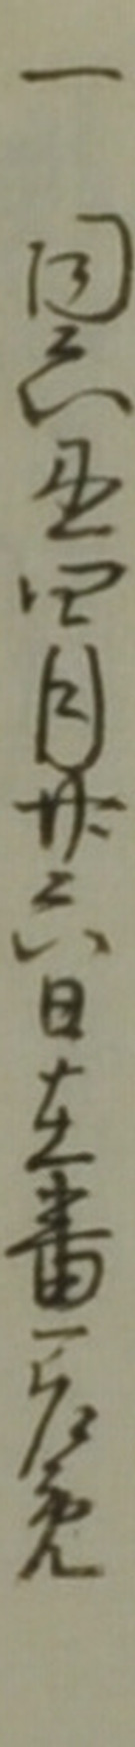一同六丑四月廿六日在番差免
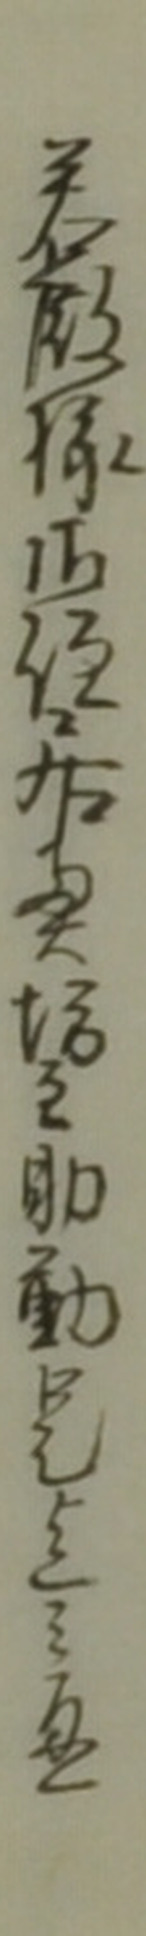若殿様御住居奥坊主助勤是迄之通
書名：無足諸士勤仕録（八）
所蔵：伊那市立高遠町図書館・合同会社AMANE
